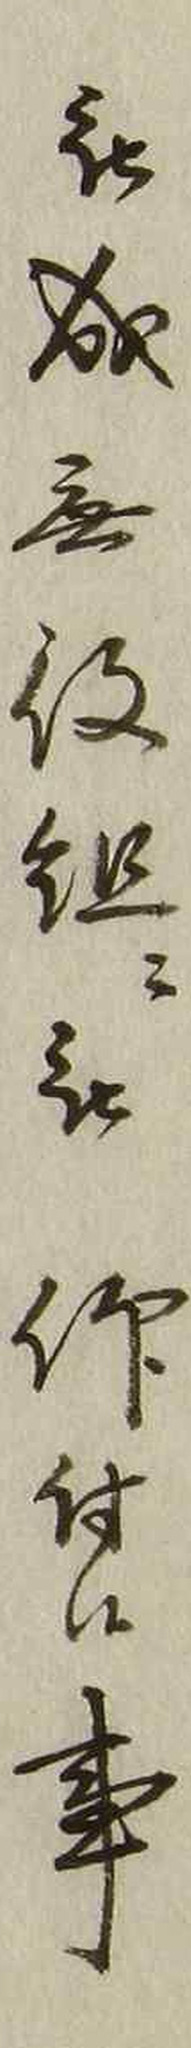被成無役組ニ被仰付候事
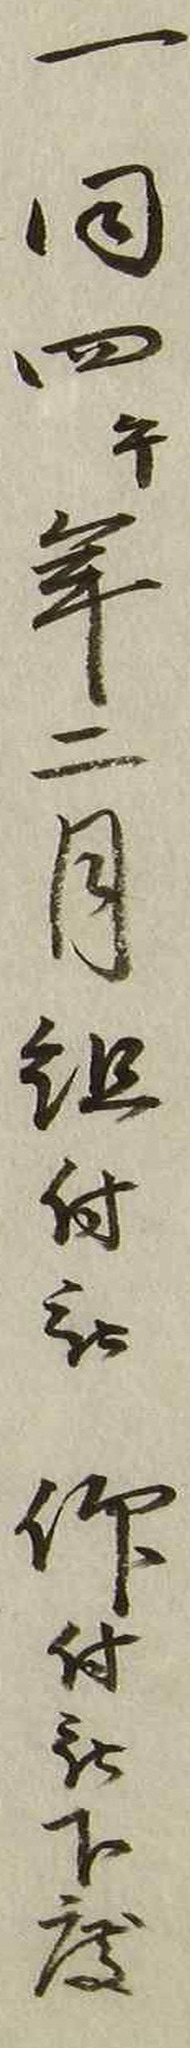一同四午年二月組付被仰付被下度
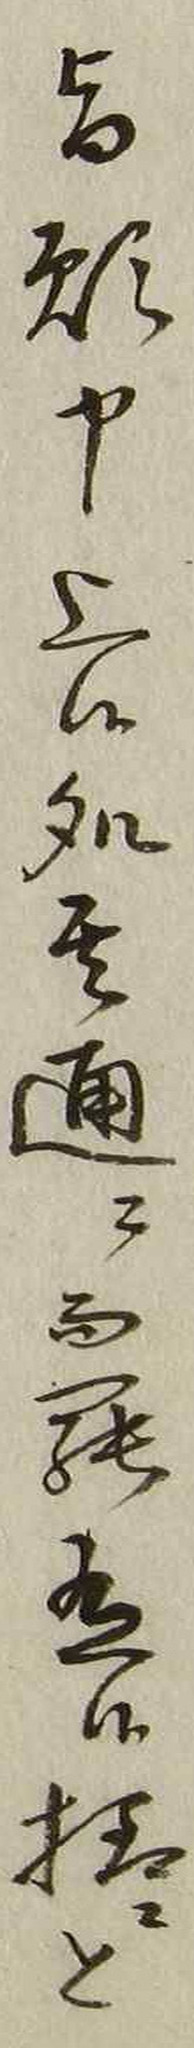旨願申上候処其通ニ而罷有候様ニと
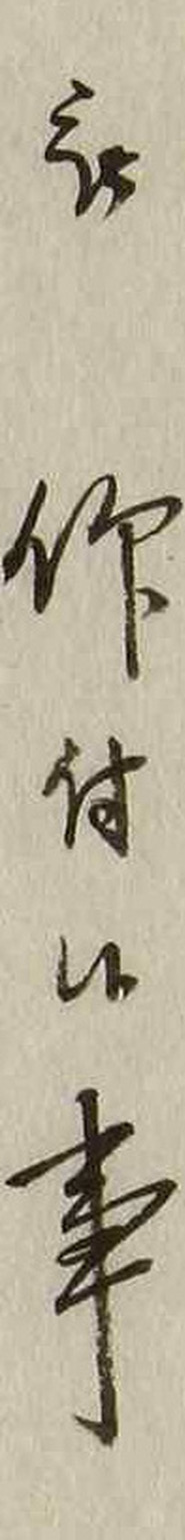被仰付候事
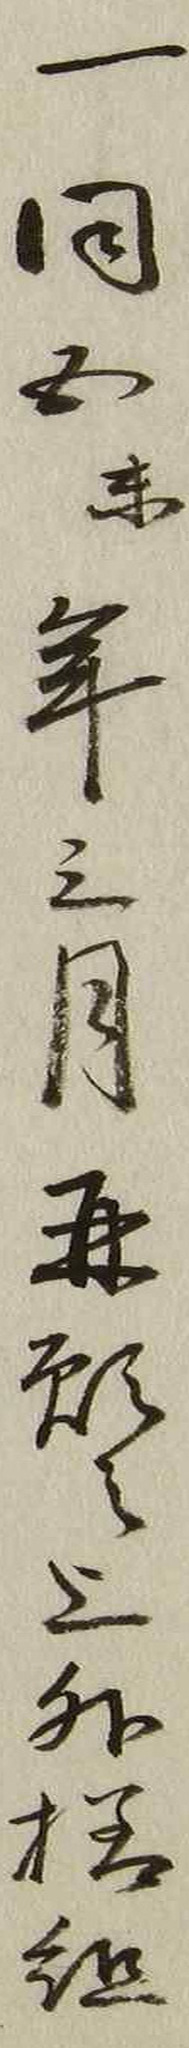一同五未年三月再願之上外様組
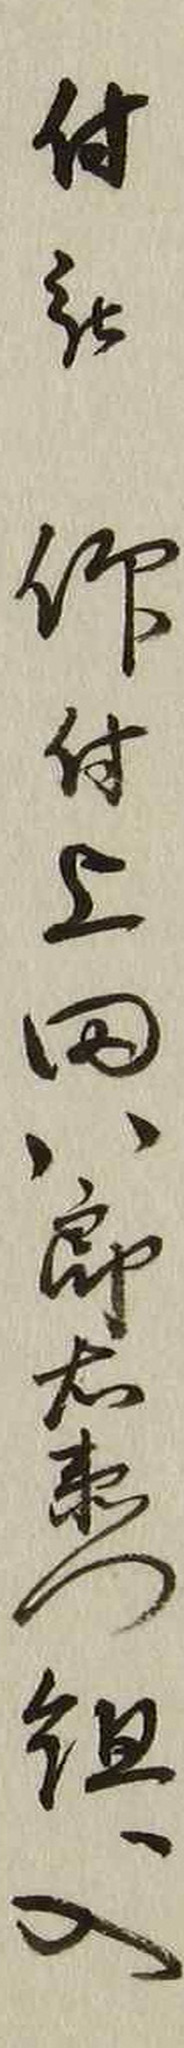付被仰付上田八郎右衛門組へ入
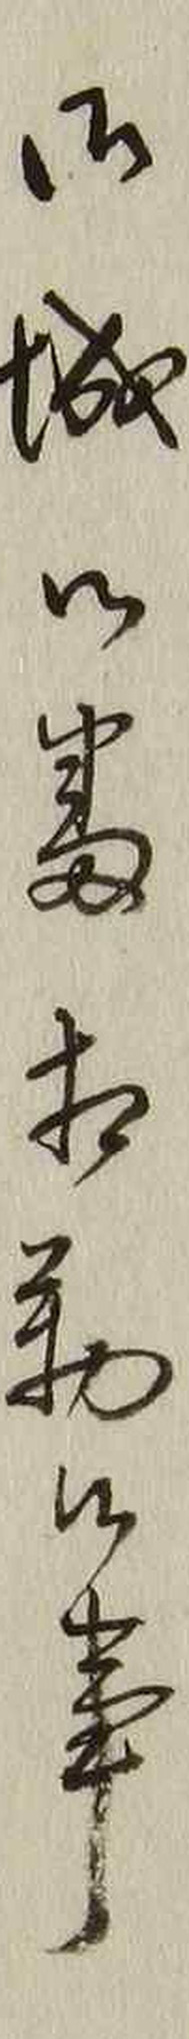御城御番相勤候事
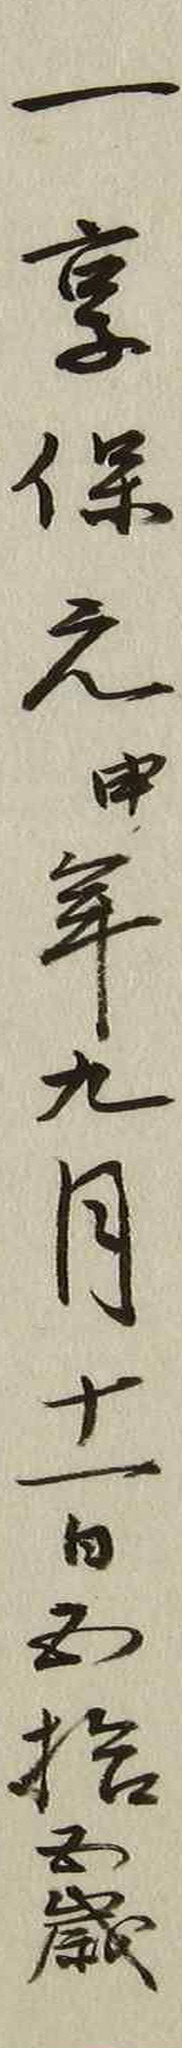一享保元申年九月十一日五拾五歳
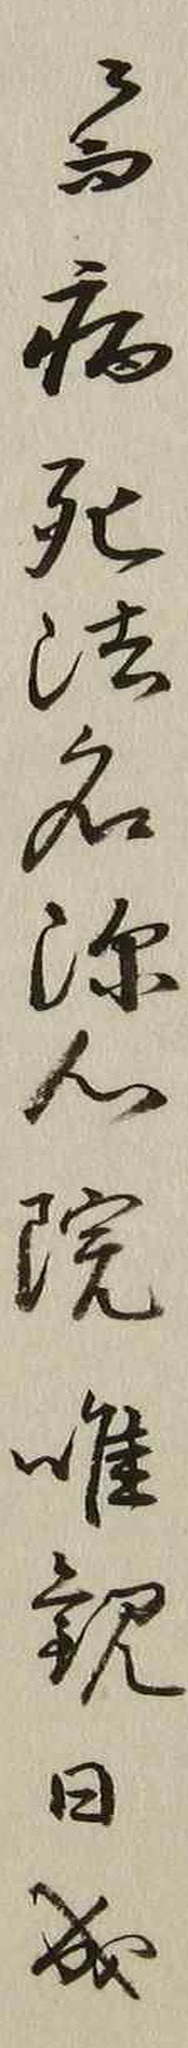ニ而病死法名深心院唯観日成
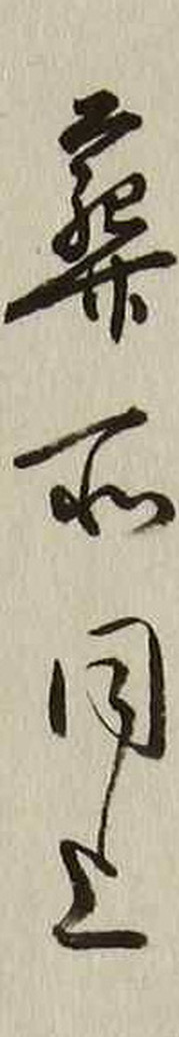葬所同上
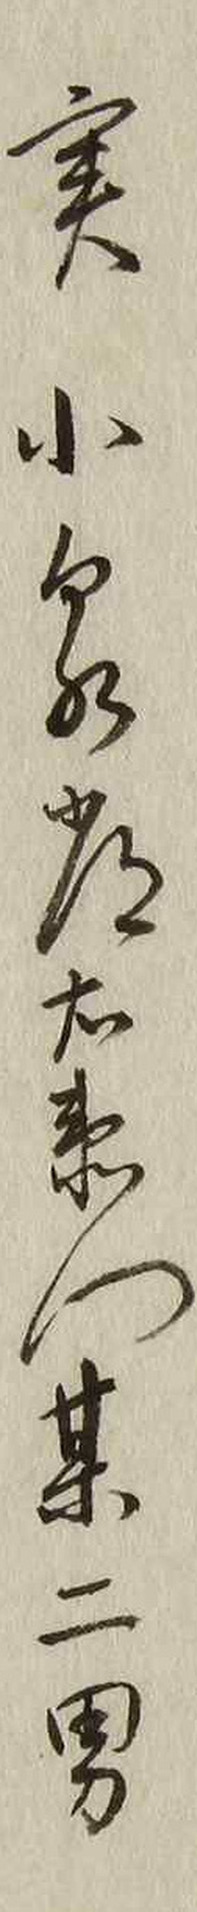実小泉常右衛門某二男
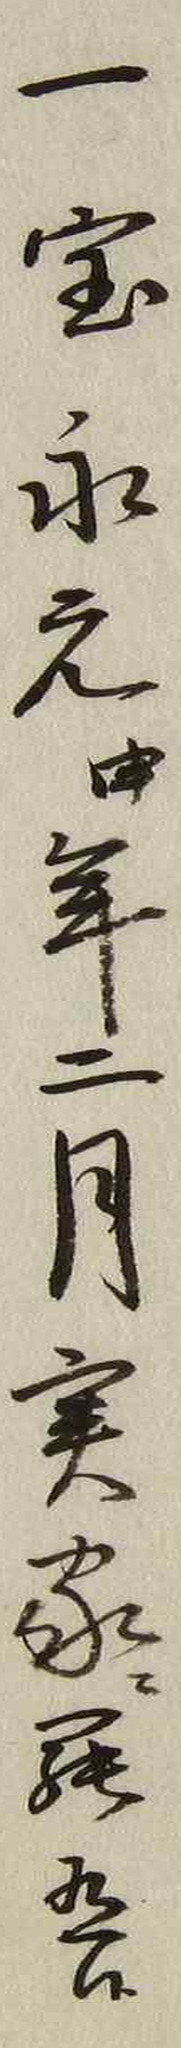一宝永元申年二月実家ニ罷有候
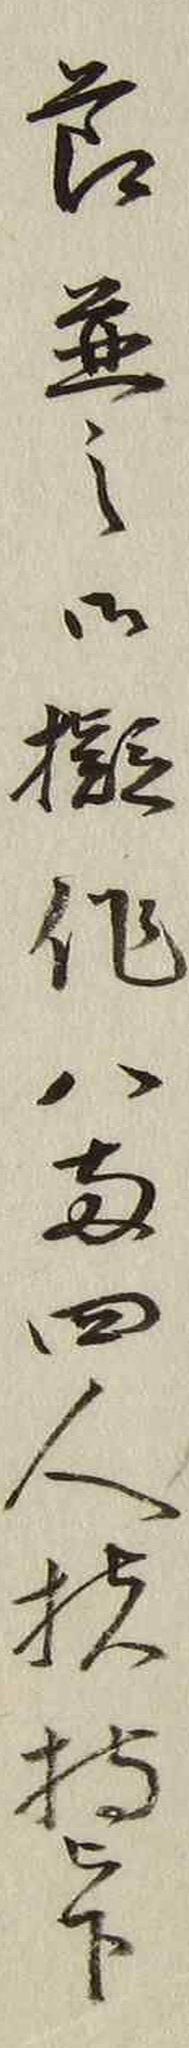節並之御擬作八両四人猪持被下
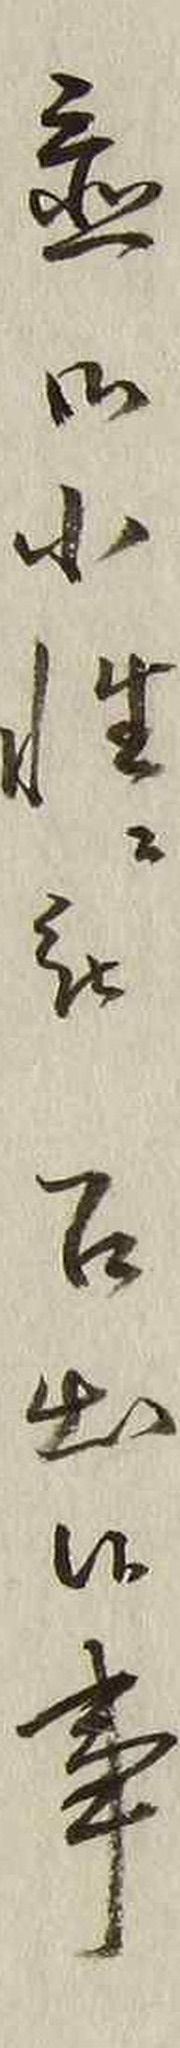置御小性ニ被召出候事
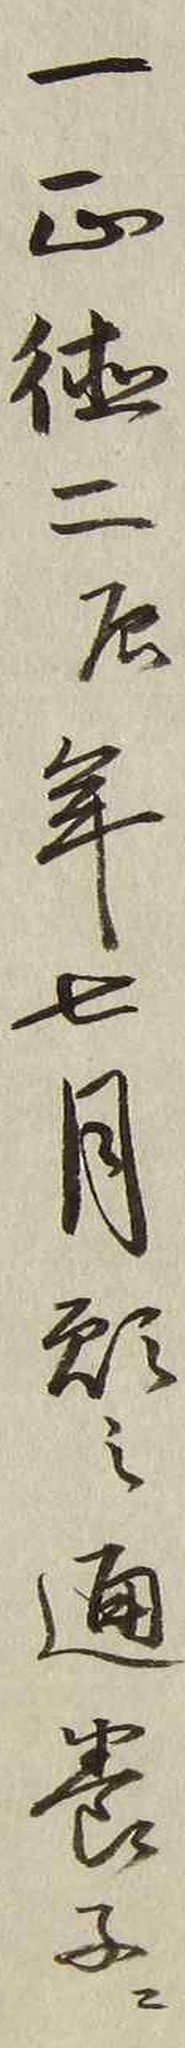一正徳二辰年七月願之通養子ニ
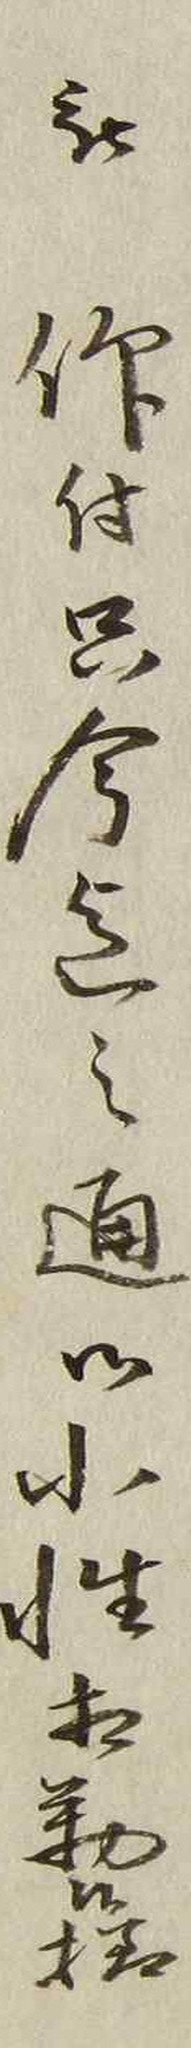被仰付只今迄之通御小性相勤候様
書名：諸士系譜　巻之149　そ之部2
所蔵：会津若松市立会津図書館
